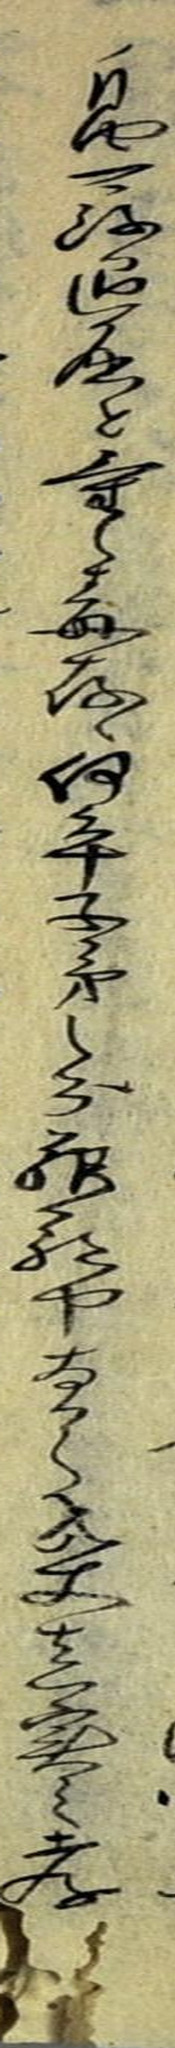自由可致退屈と気之毒存候何卒子弟之分艱難中なから成丈真実之孝
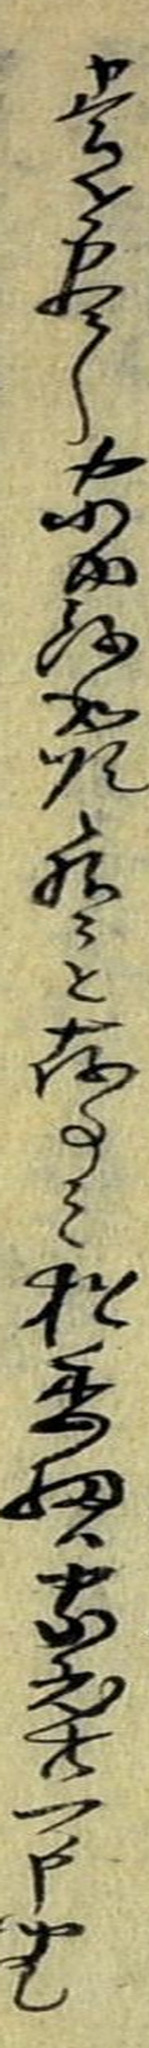養を尽し中小内致和順候様ニと存事之猶委細ハ家老共可申聞候
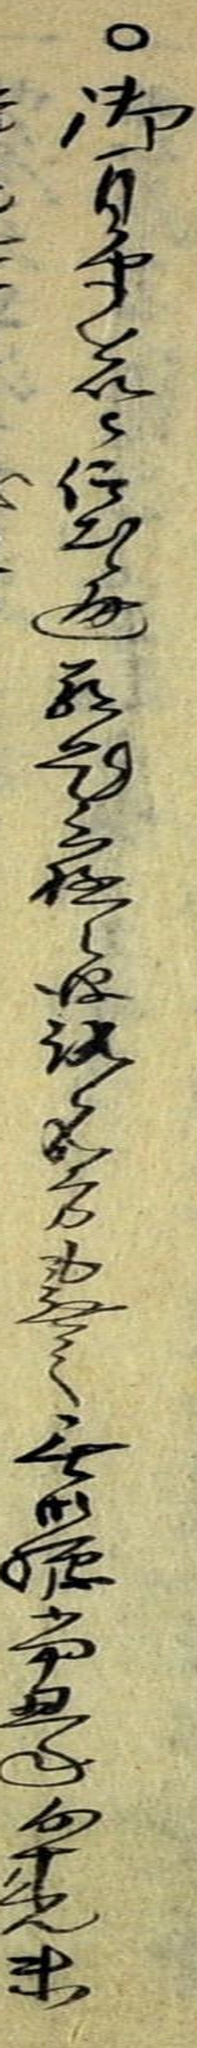○御自筆を以被仰出候通難題至極之儀誠被成方も無之無御拠当丑年ゟ来未
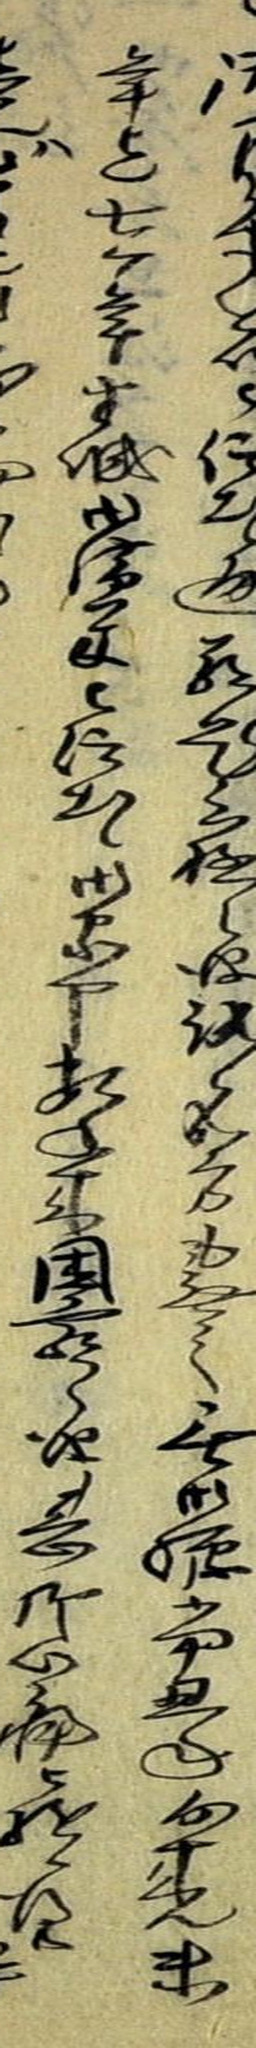年迄七ケ年半減御借米被仰出候御家中拾年来困窮之儀甚御心痛被遊候得共畢
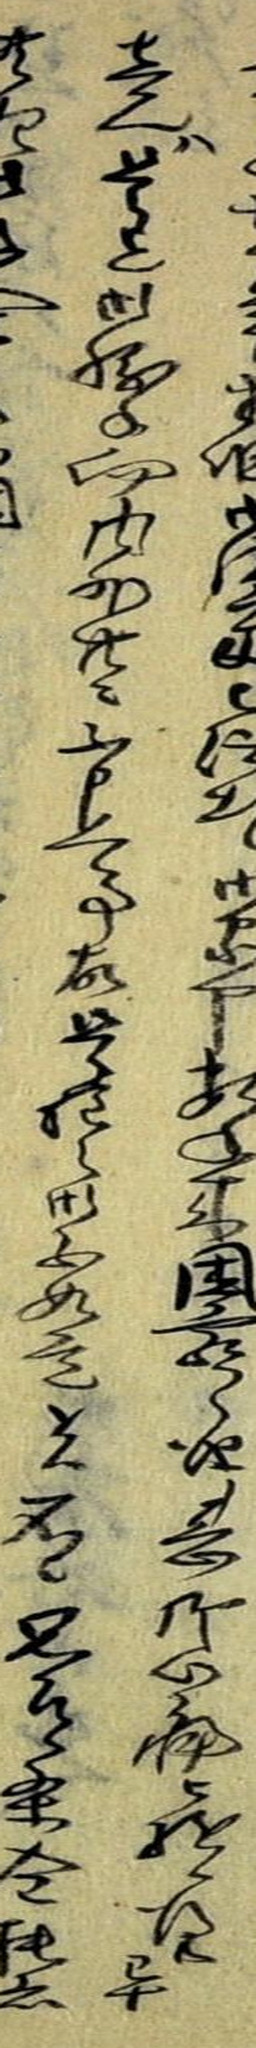竟ハ是迄御勝手向内外共ニ不申上事故是程之御不如意とハ不被思召候条仝拙者
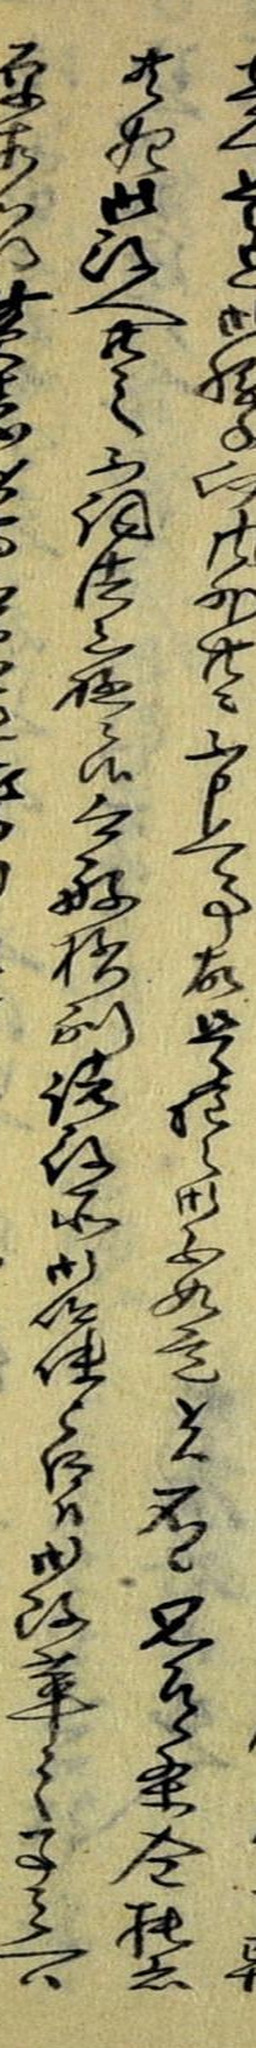共始御役人共之不調法至極ニ候今般格別諸役所御吟味被仰付御改革之事ニ候へハ
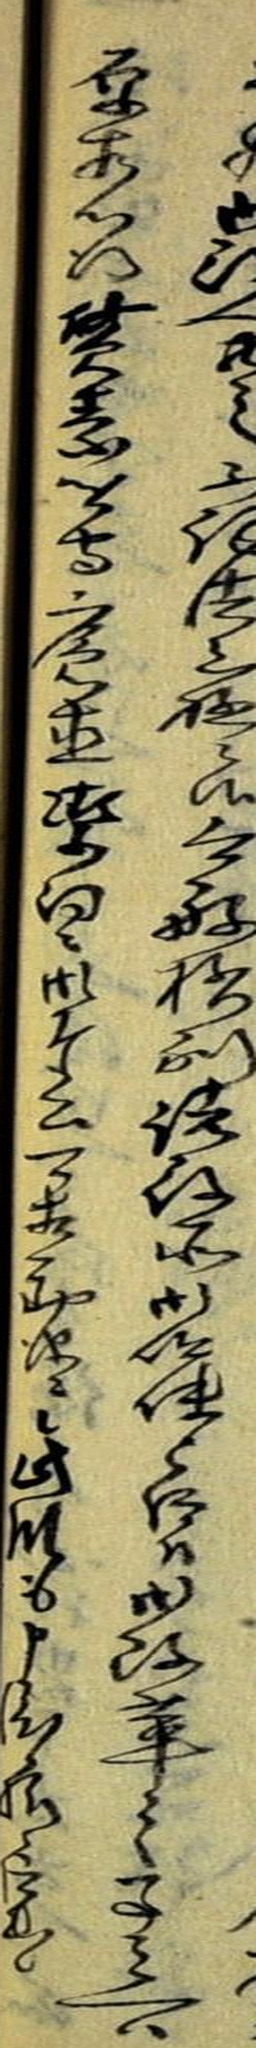厚相心得質素を守廉直潔白ニ御奉公可相勤儀ニ候此段も申渡候様被仰出候
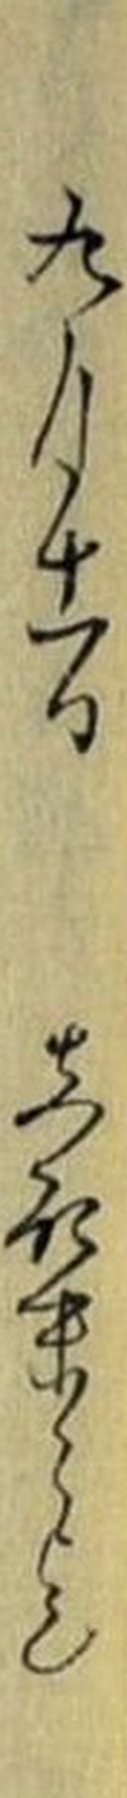九月十一日支配末々迄
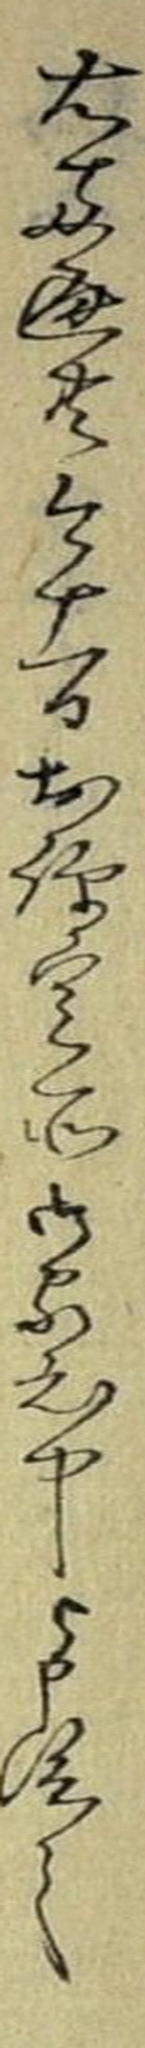右両通共今十一日於評定所御家老中被申渡之
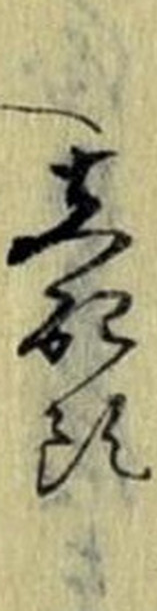支配頭
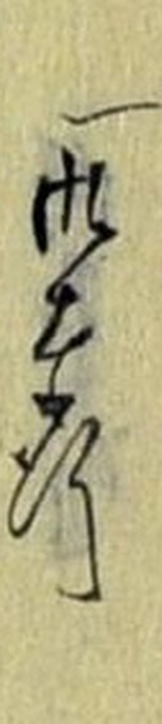御奉行
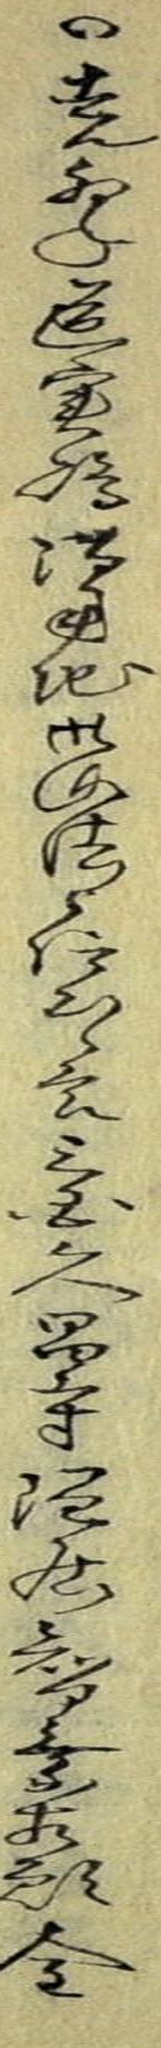○去ル卯年道実島御用地御趣法被仰出候節三国久昌寺隠居智乗相願金
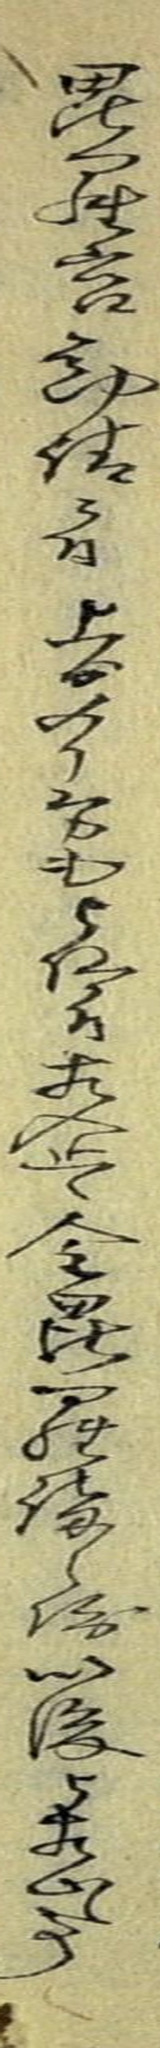毘羅宮勤請ニ付上ゟ〆り方も被仰付相企候金毘羅構之儀以後被相止候事
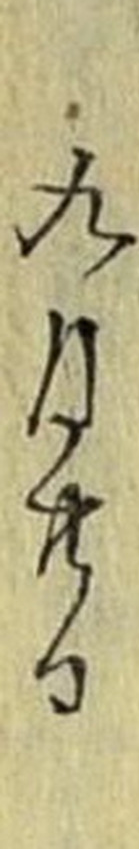九月廿日
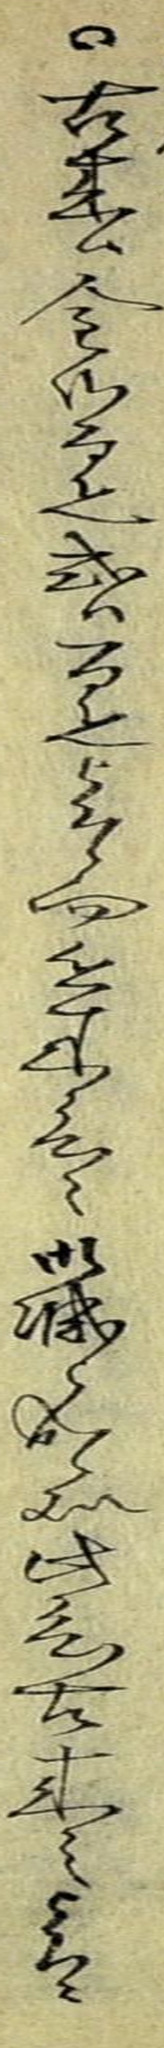○古来ハ金弐百疋或ハ百疋被下候向近来度々御減被成候処此度古来之被下ニ
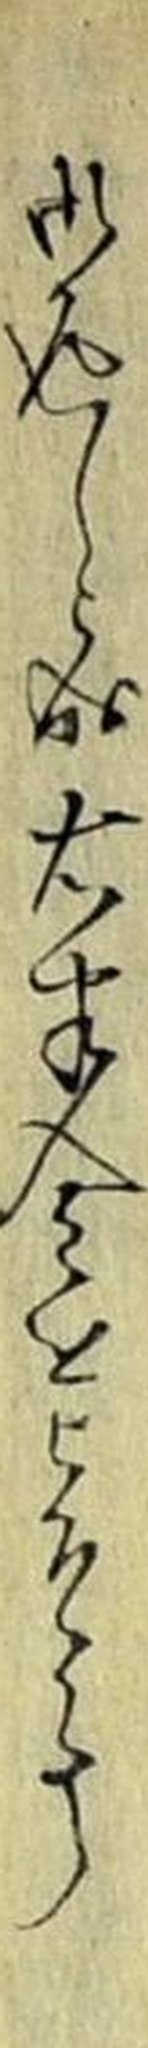御返し被成右半金を被下候事
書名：命令之部 五
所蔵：福井県文書館 Fukui Prefectural Archives
